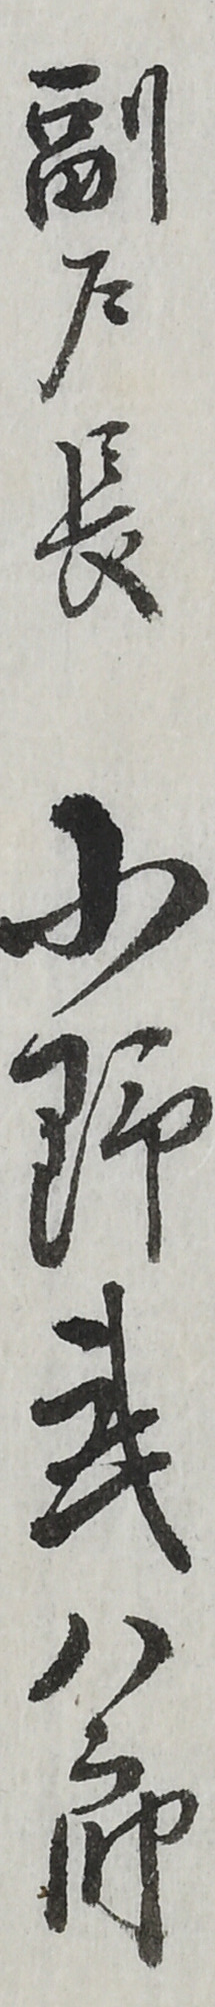副戸長小野武八郎
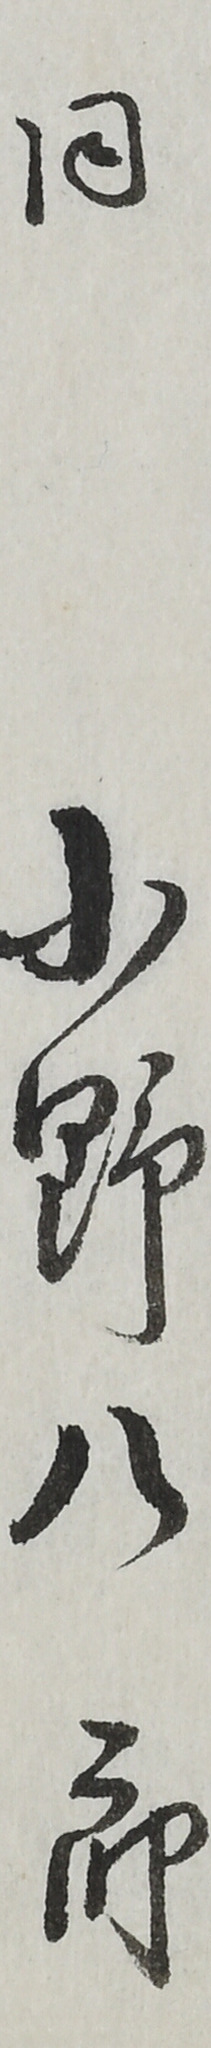同小野八郎
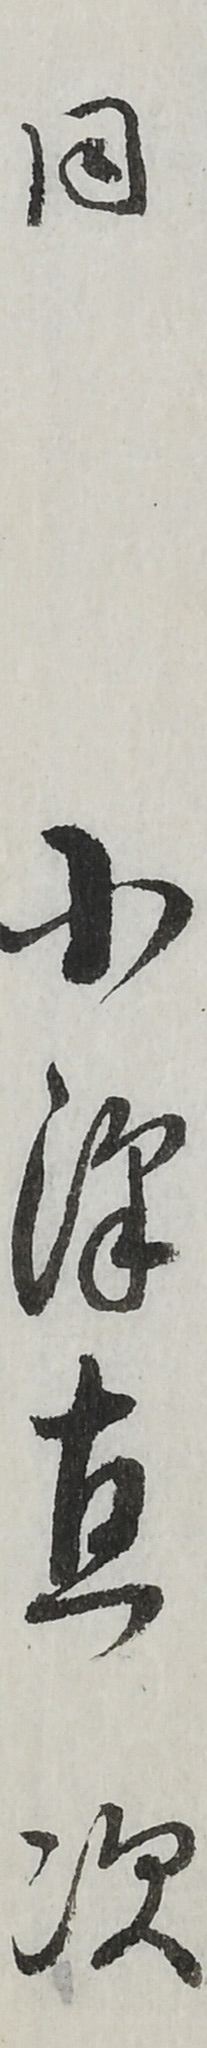同小澤直次

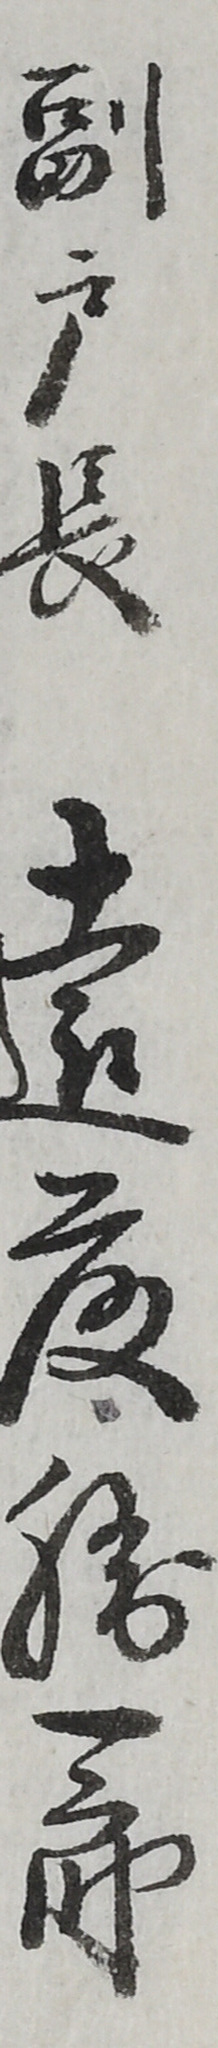副戸長遠藤勝一郎
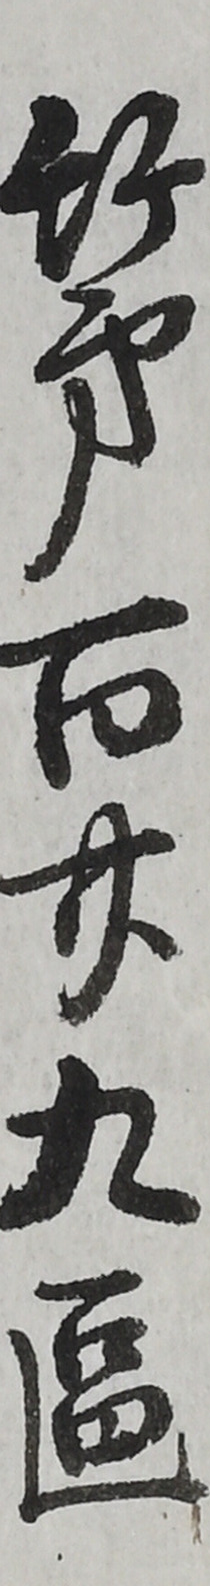第百廿九区
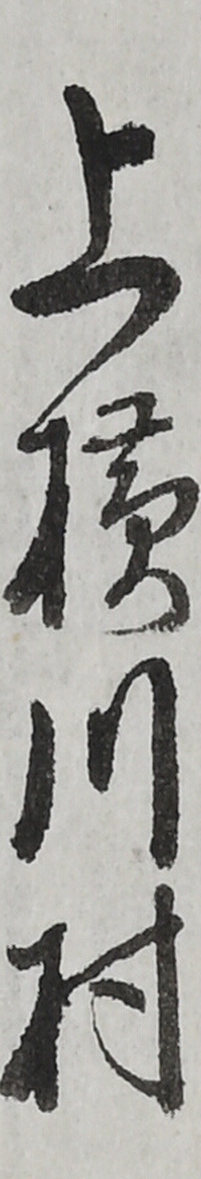上横川村
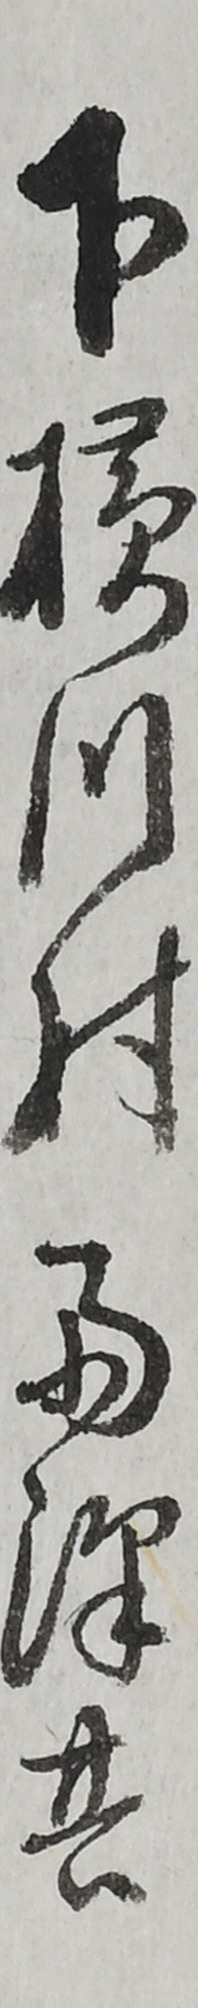下横川村両澤共
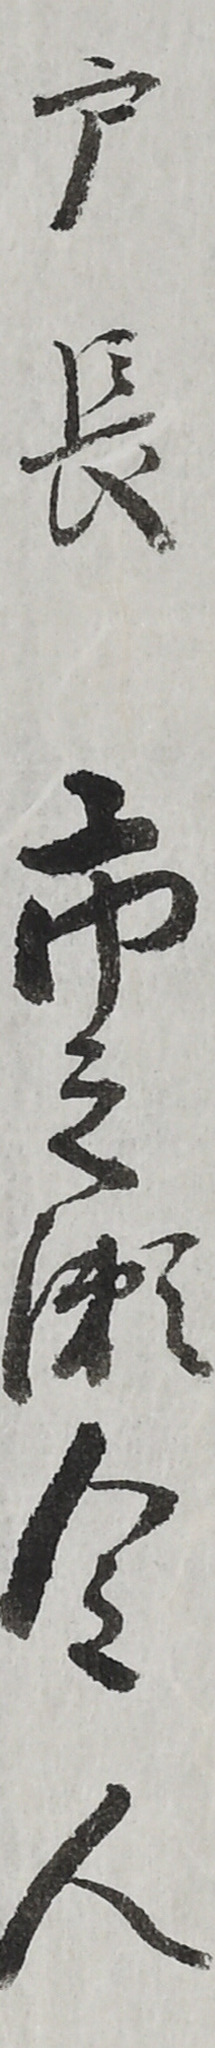戸長市之瀬全人
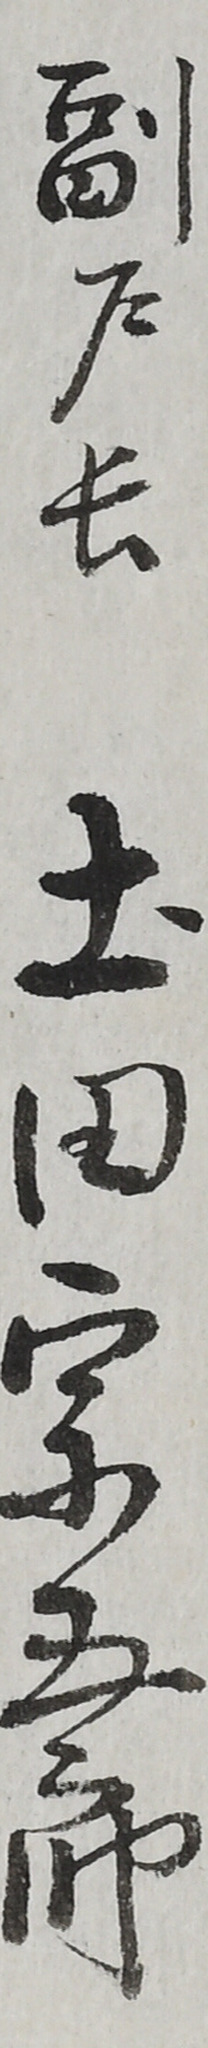副戸長土田宗五郎
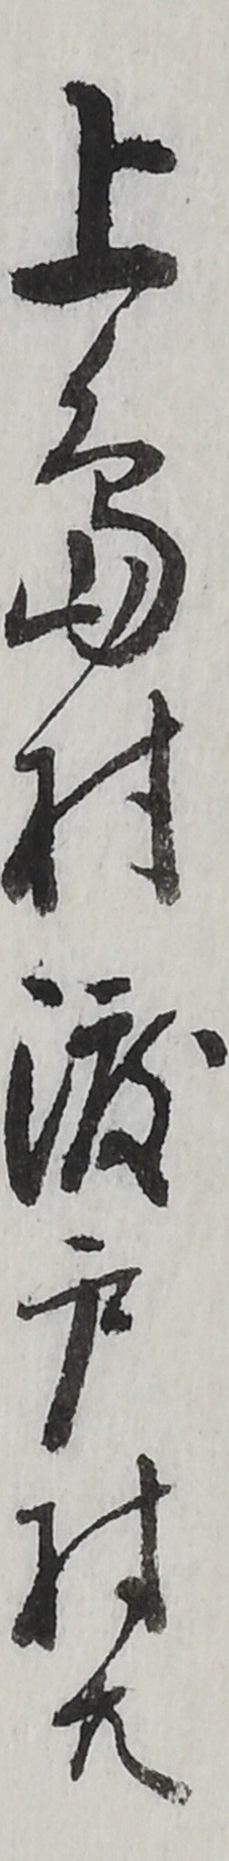上島村渡戸村共
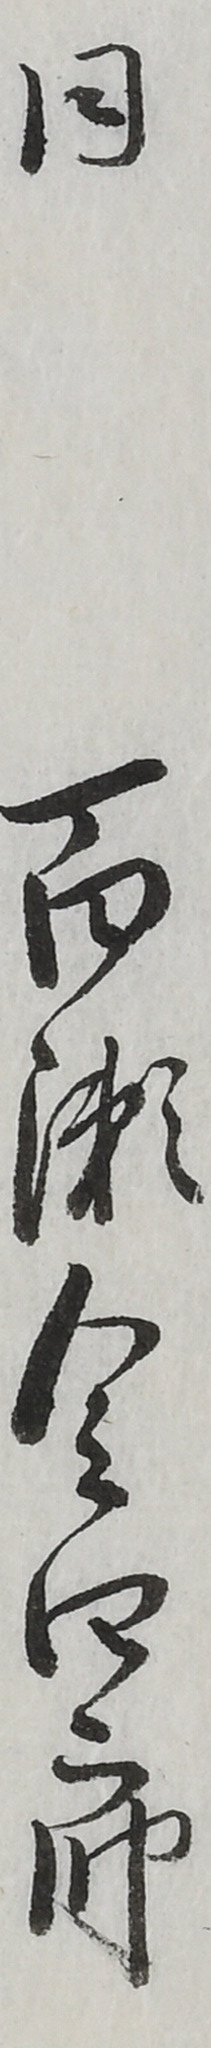同百瀬全四郎
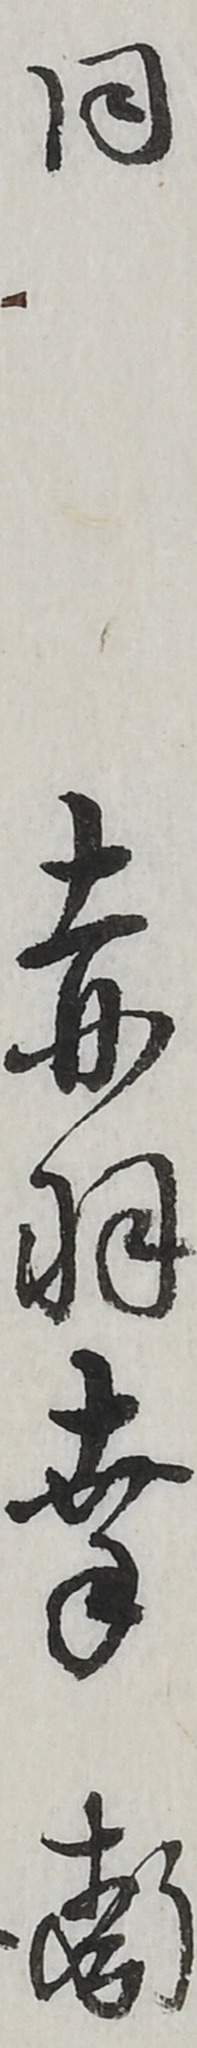同赤羽幸衛
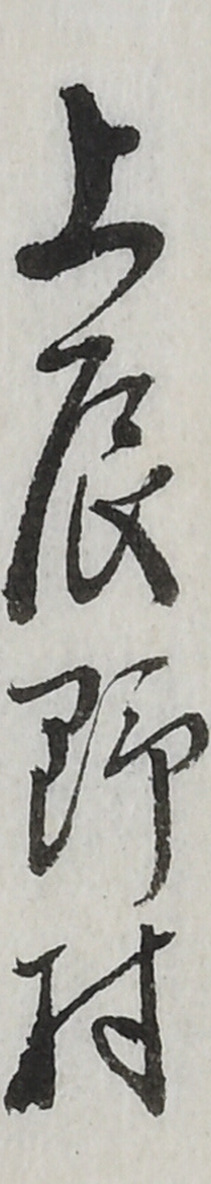上辰野村
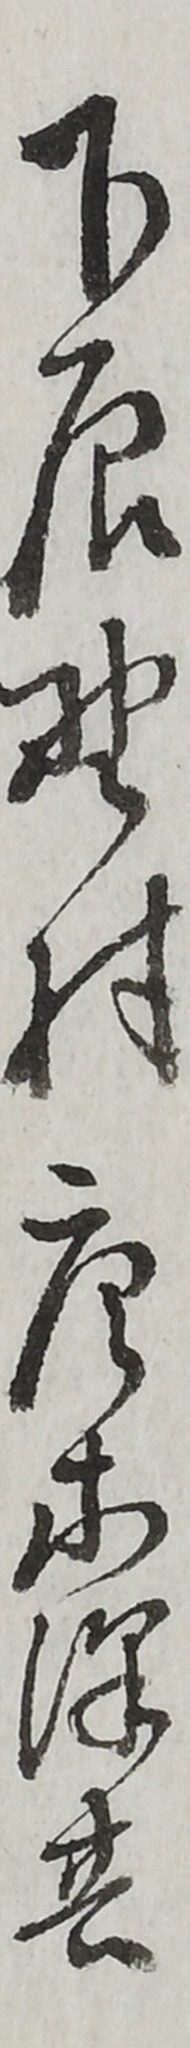下辰野村唐木澤共
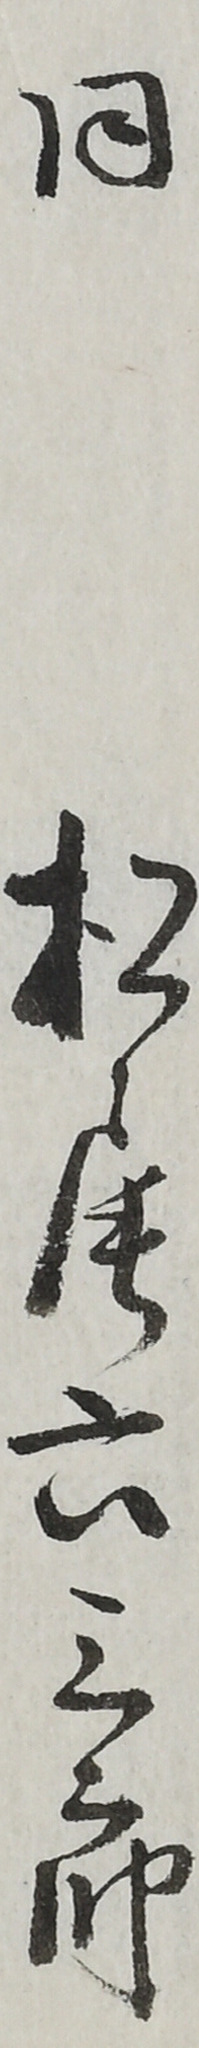同松尾六三郎
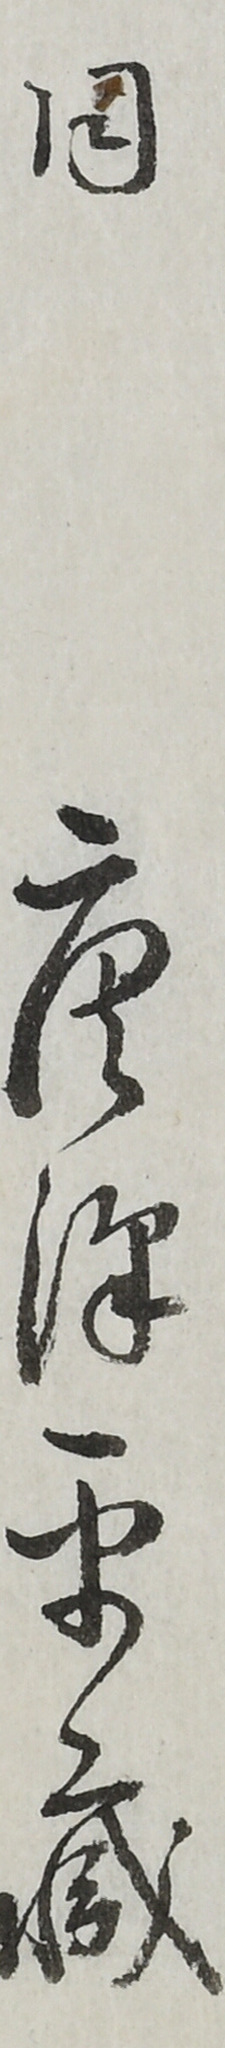同唐澤平蔵
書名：伊那郡毎村戸長副戸長名簿
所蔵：伊那市立高遠町図書館・合同会社AMANE
